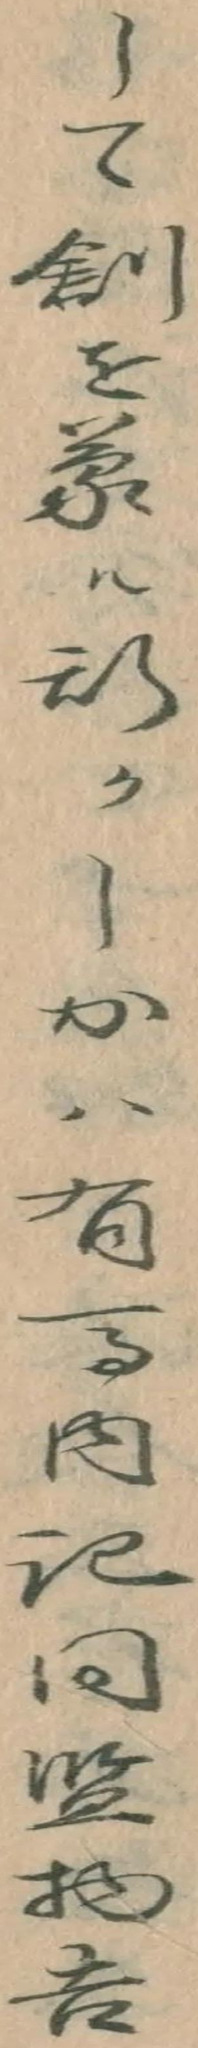して創を承る斯かしかは有馬内記同監物吉
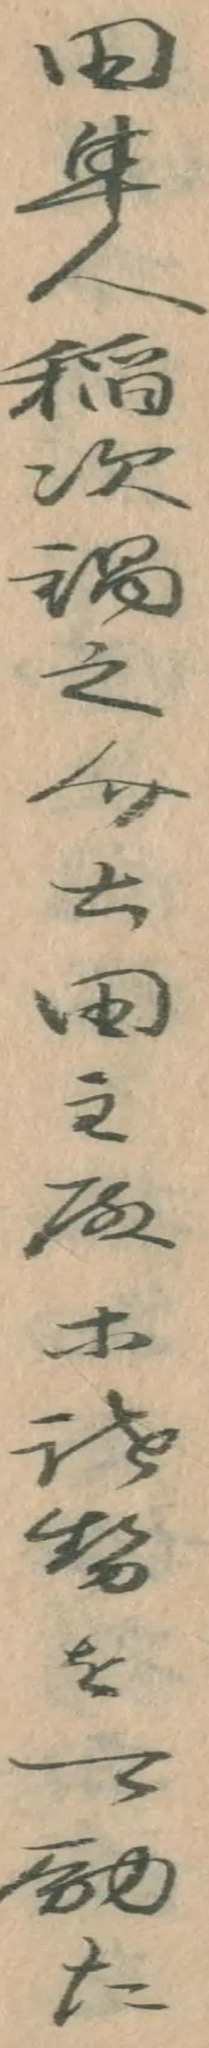田隼人稲次鍋之介土田主殿等諸勢を可励た

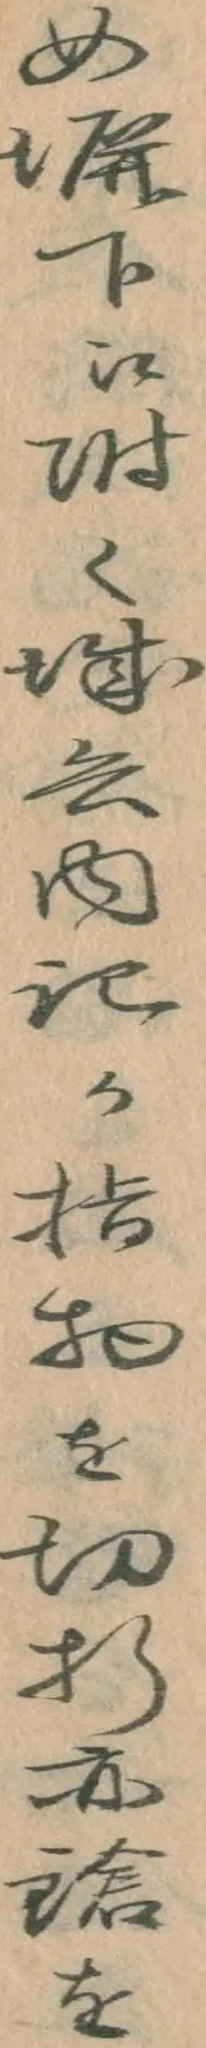め塀下江附く城兵内記か指物を切折亦鎗を
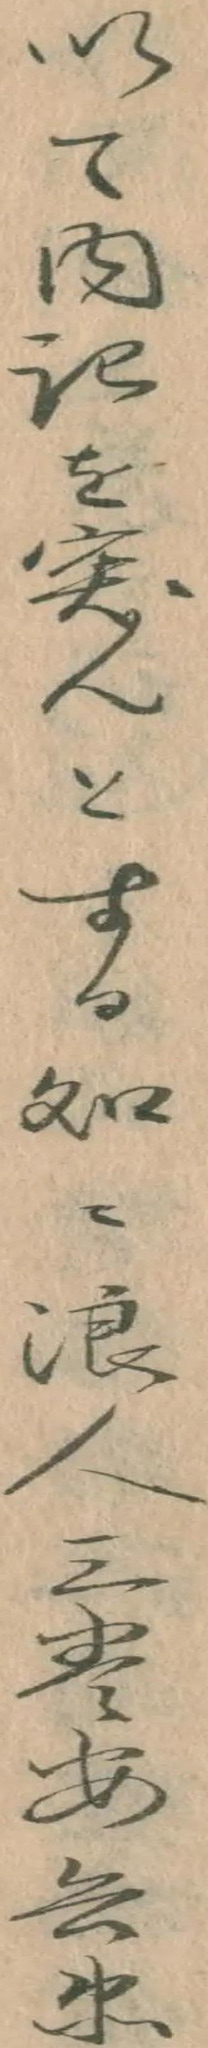以て内記を突んとする処に浪人三巻安兵衛
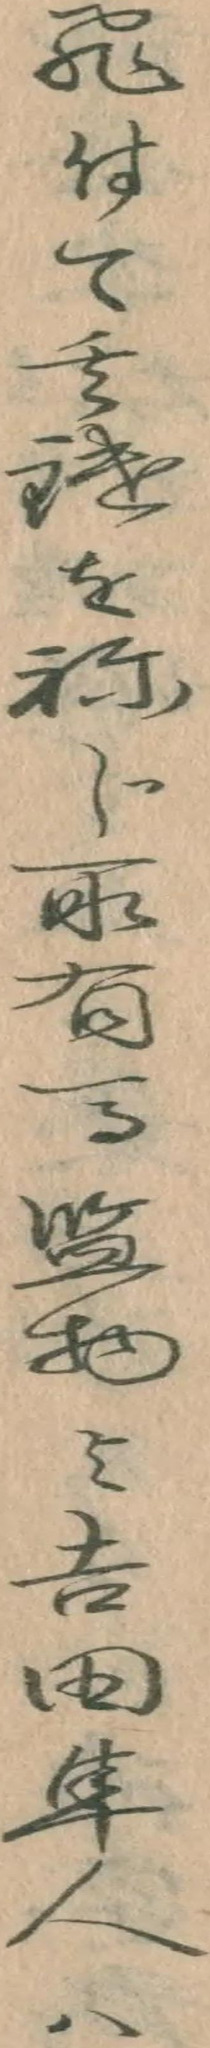飛付て其鑓を称じ取有馬監物与吉田隼人は
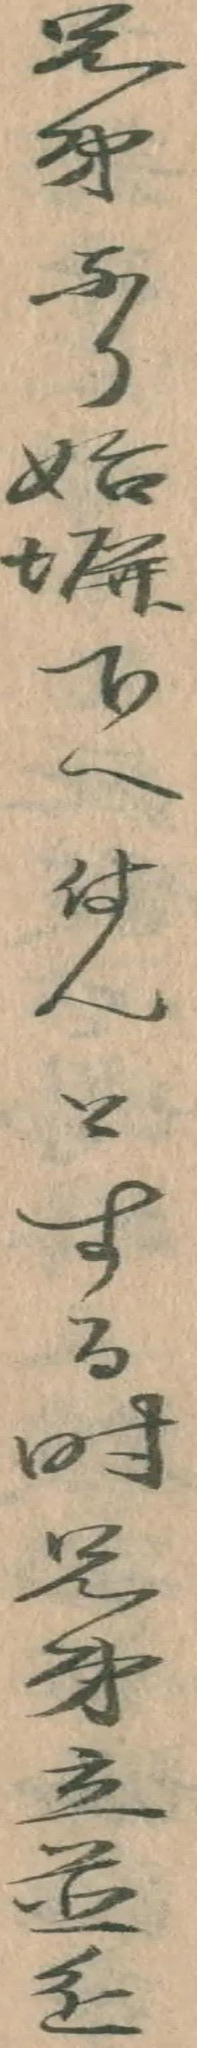兄弟なり始塀下へ付んとする時兄弟立並進
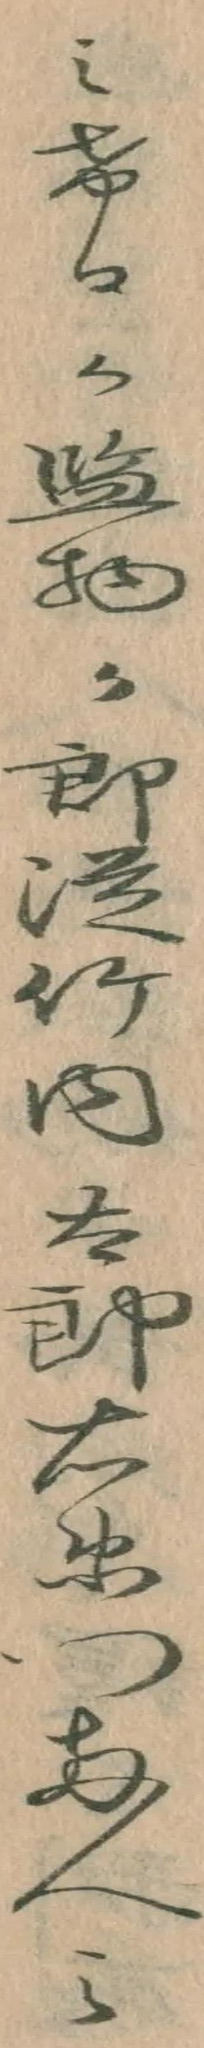之希るか監物か郎従竹内太郎右衛門両人之
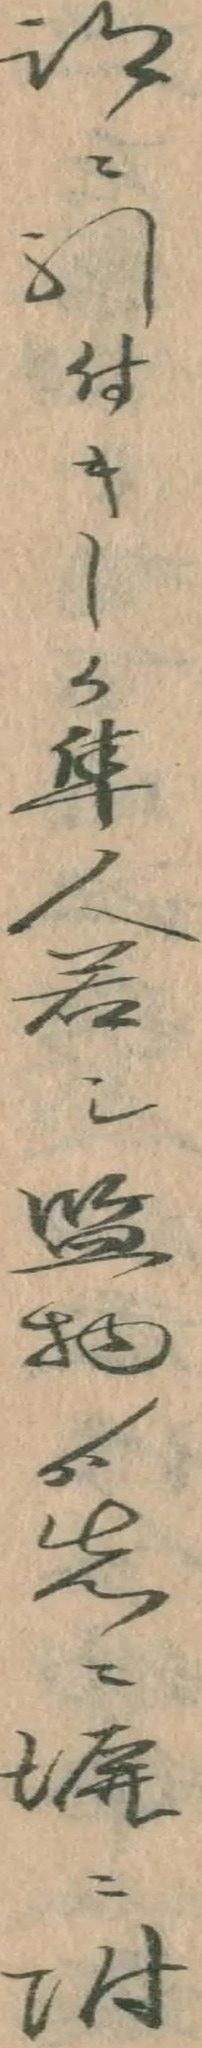跡に引付きしか隼人若し監物ゟ先に塀に附
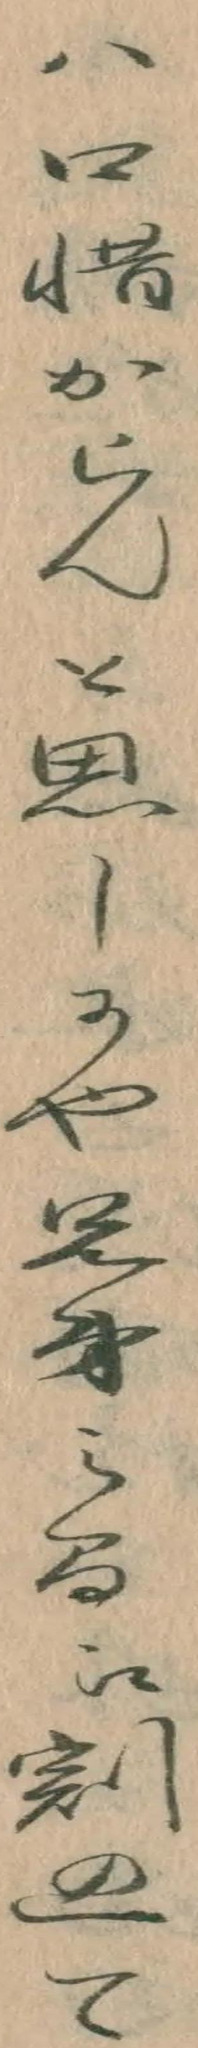は口惜からんと思し尓や兄弟之間江割込て
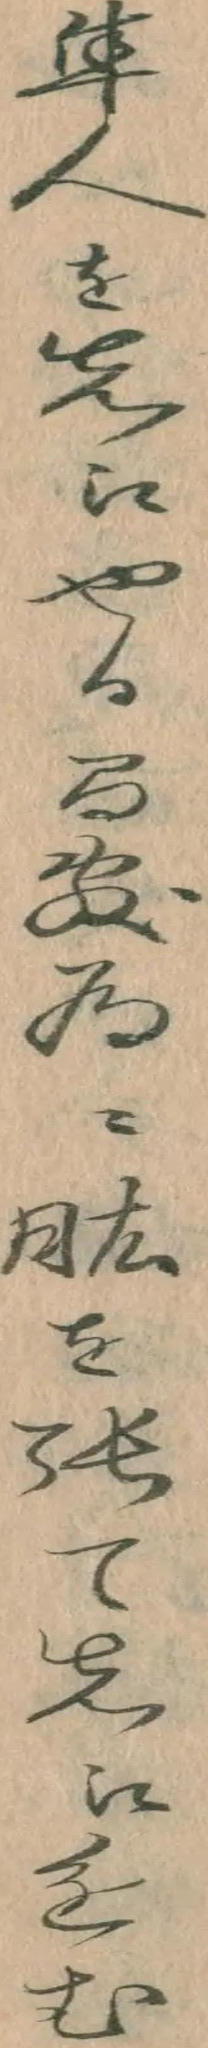隼人を先江やる間敷為に肱を張て先江進む
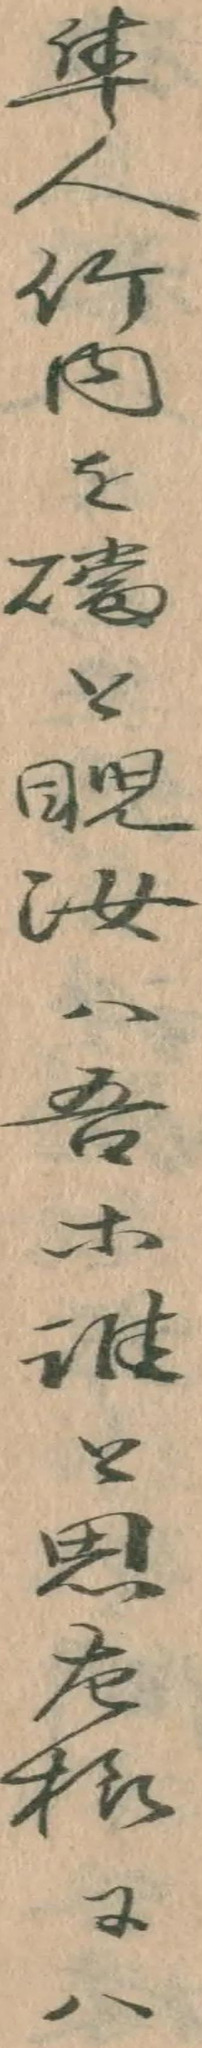隼人竹内を礑と睨汝は吾等誰と思左様尓は
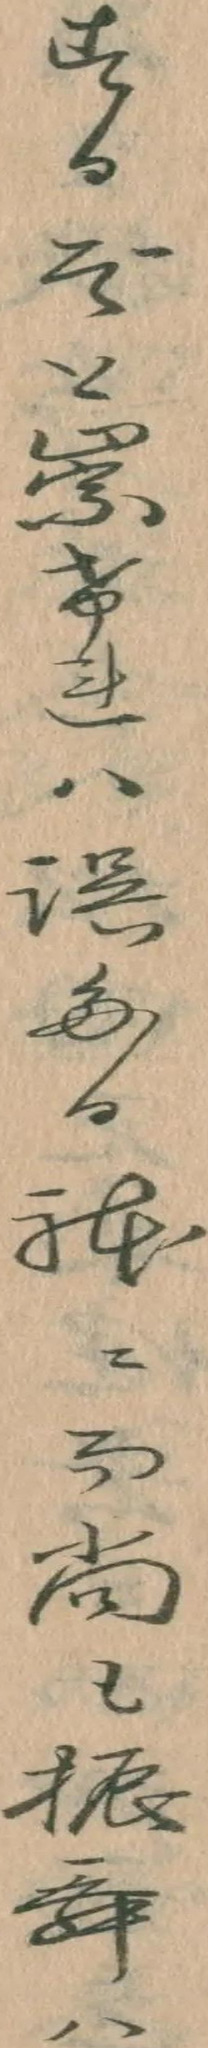春るぞと嵩希連は誤多る躰に而尚も振舞は
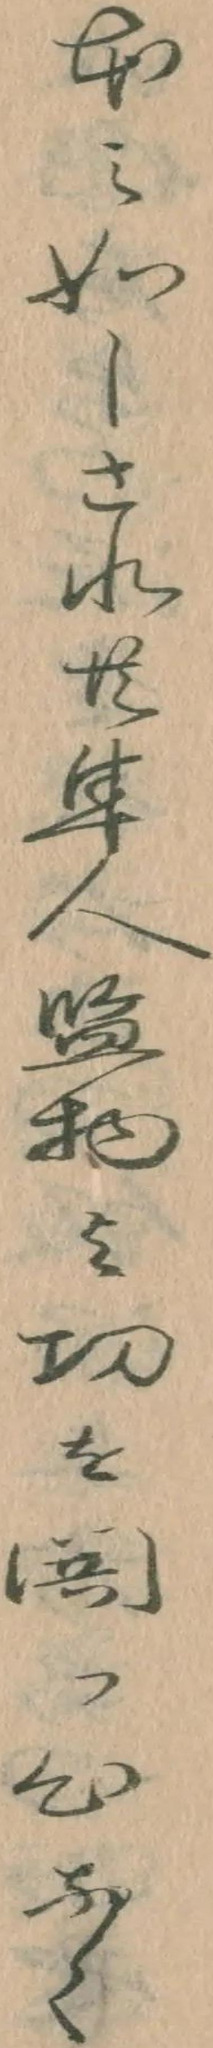本之如しされ共隼人監物与功を鬨つ心なく
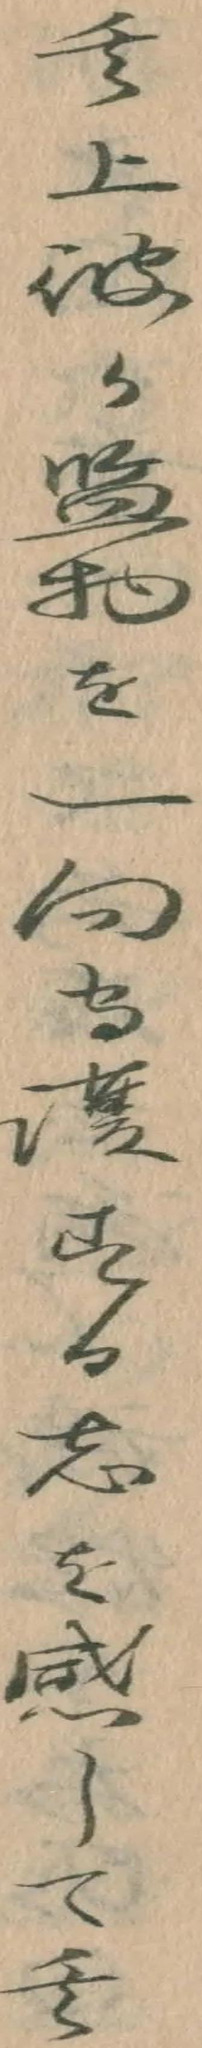其上彼か監物を一向守護春る志を感して其
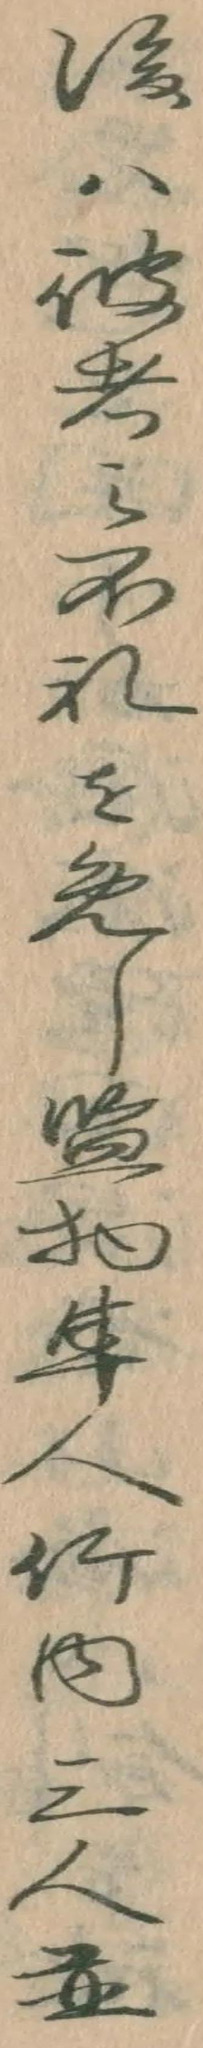後は彼者之不礼を免し監物隼人竹内三人並
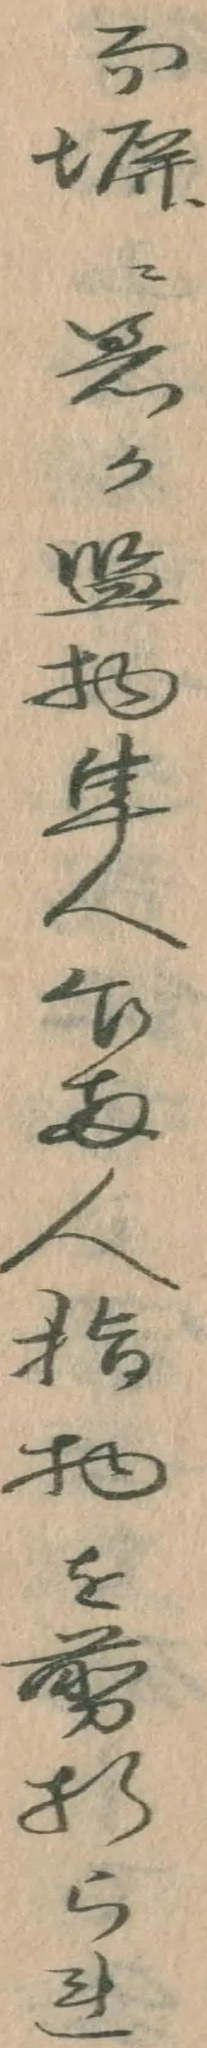而塀に着く監物隼人乍両人指物を剪折ら連
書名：切支丹御退治記 49巻. [5]
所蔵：国立国会図書館 National Diet Library, JAPAN
